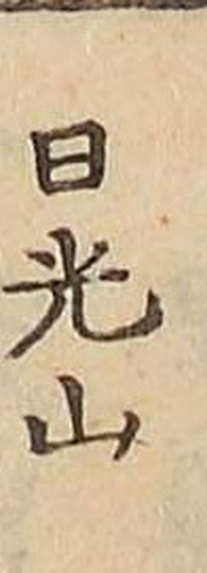日光山
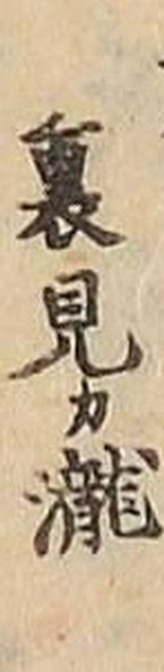裏見カ滝
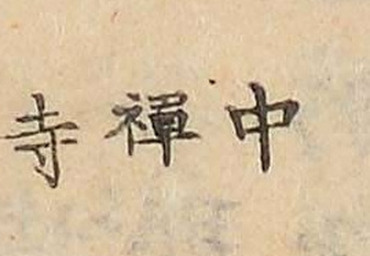中善寺

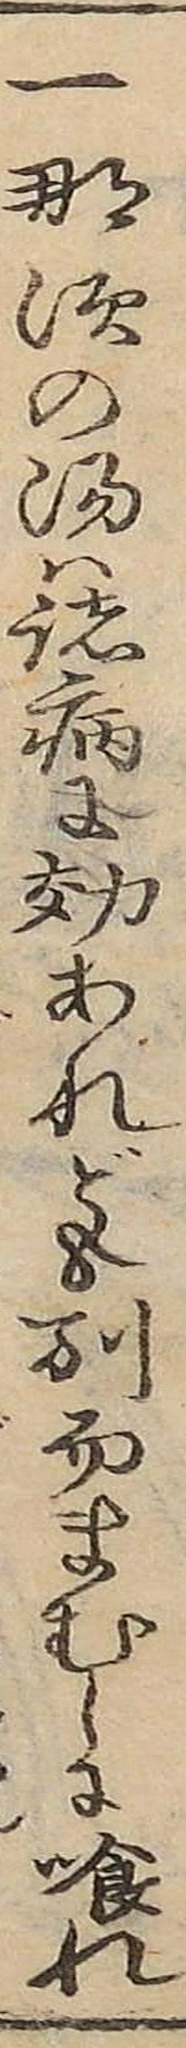一那須の湯は諸病に効あれども別而まむしに喰れ
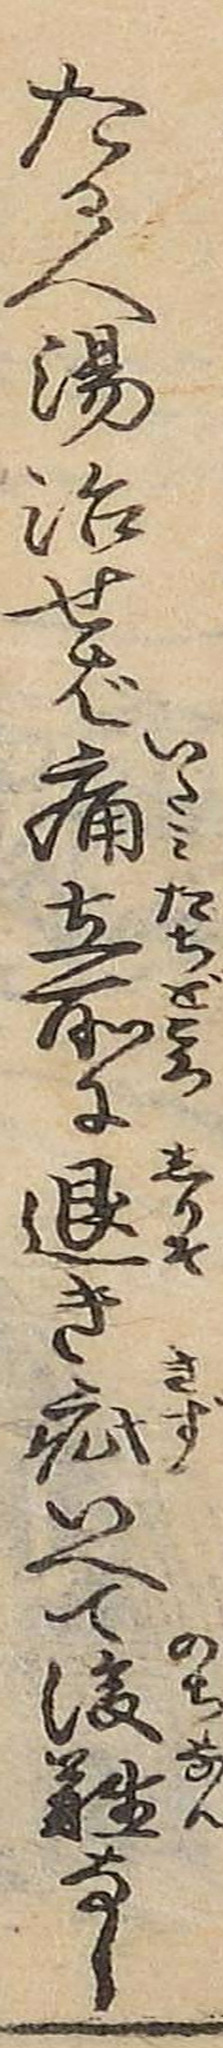たる人湯治せば痛立所に退き疵いへて後難なし
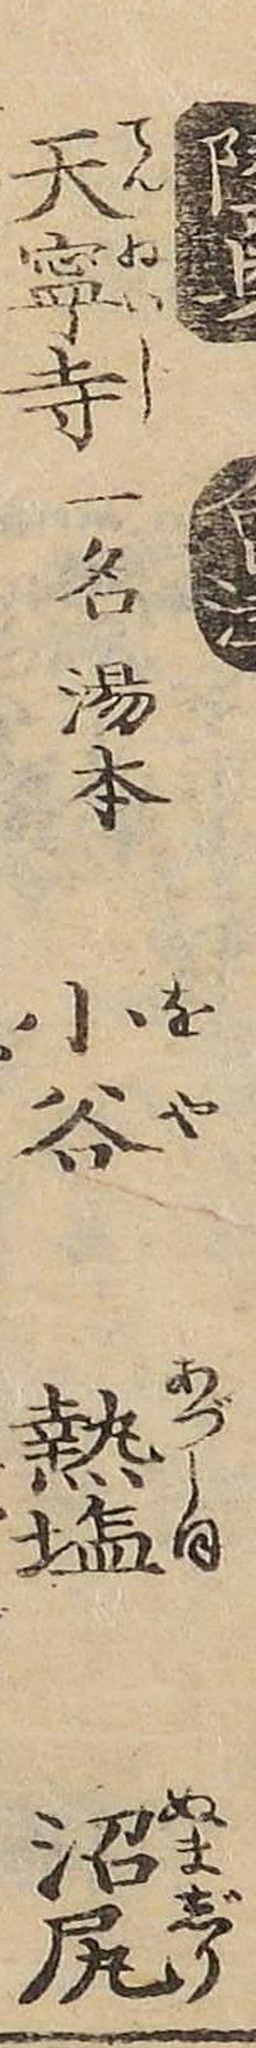天寧寺一名湯本小谷熱塩沼尻
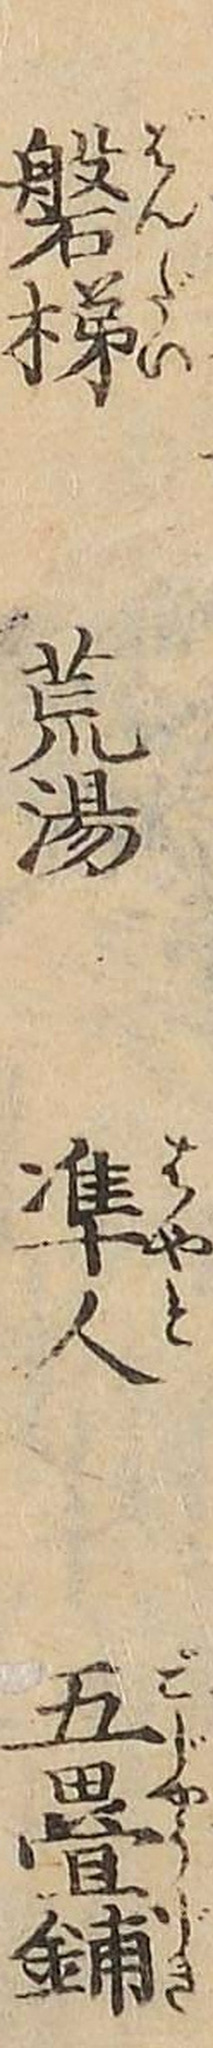磐梯荒湯隼人五畳鋪
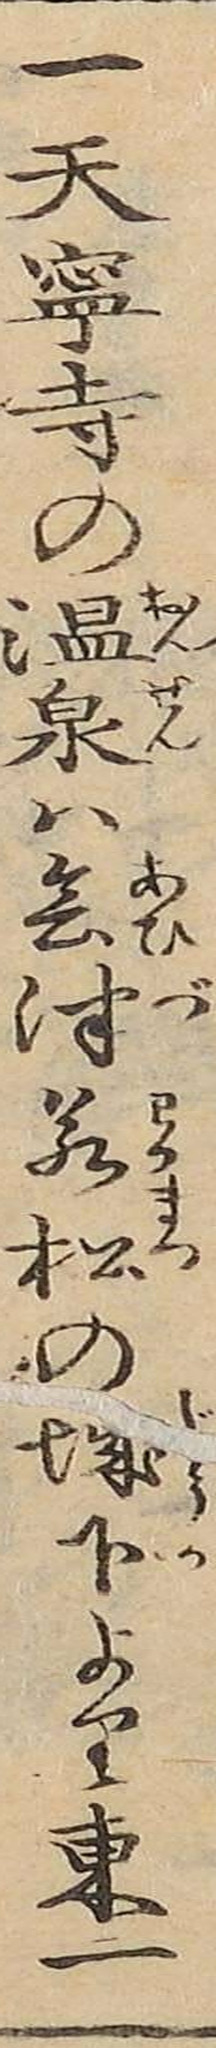一天寧寺の温泉は会津若松の城下より東一
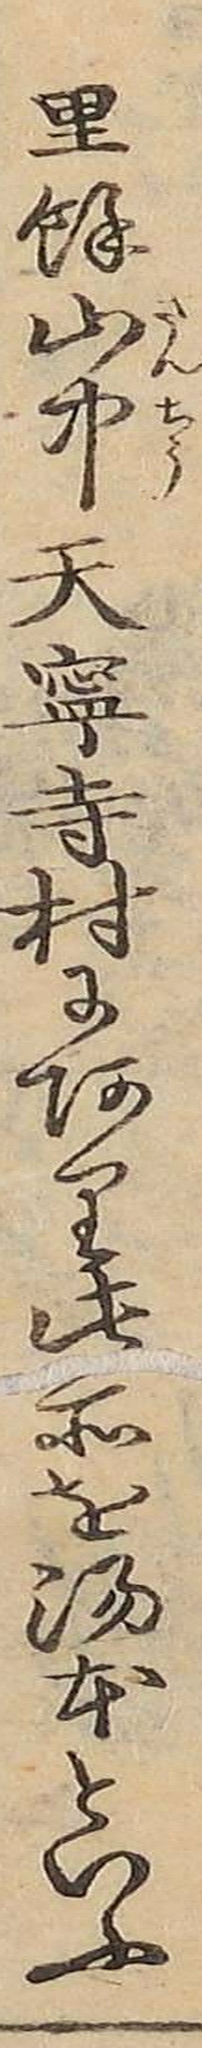里余山中天寧寺村にあり此所を湯本といふ
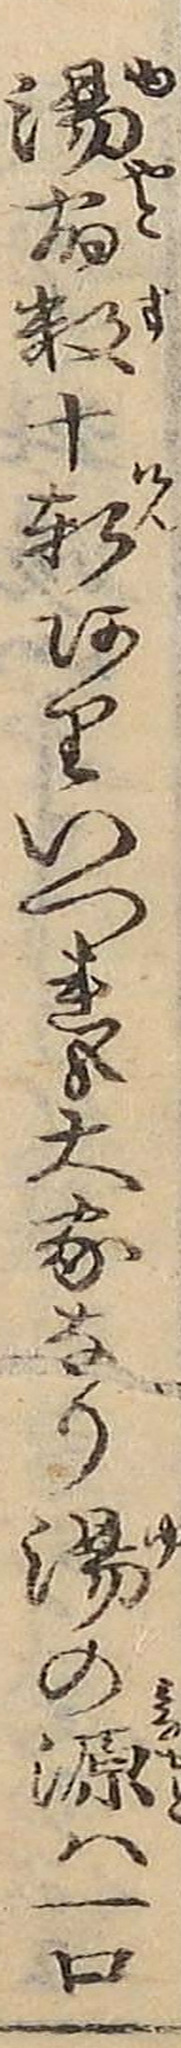湯宿数十軒ありいつれも大家なり湯の源は一口
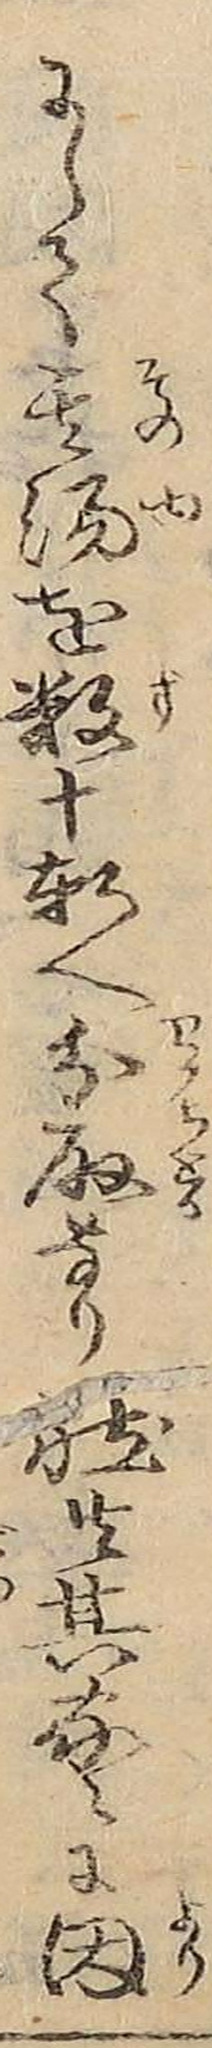にして其湯を数十軒へ分取なり然共其家に因
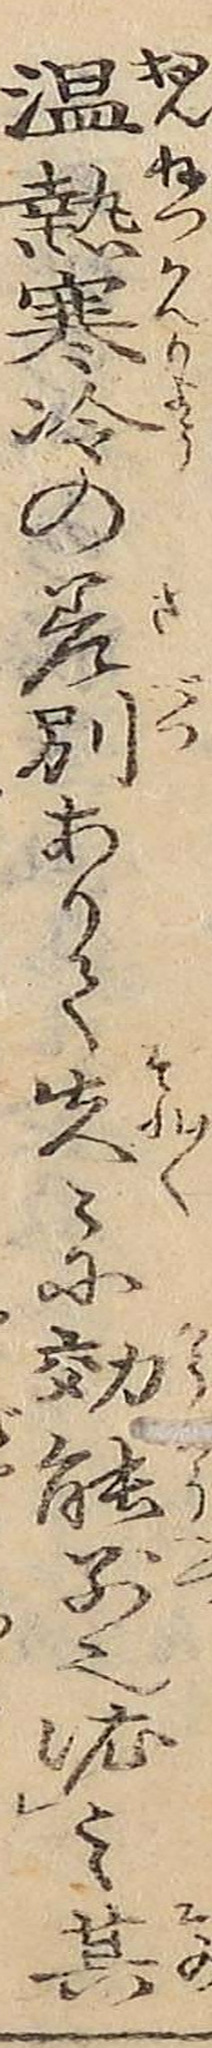温熱寒冷の差別ありて先々に効能別也依之其
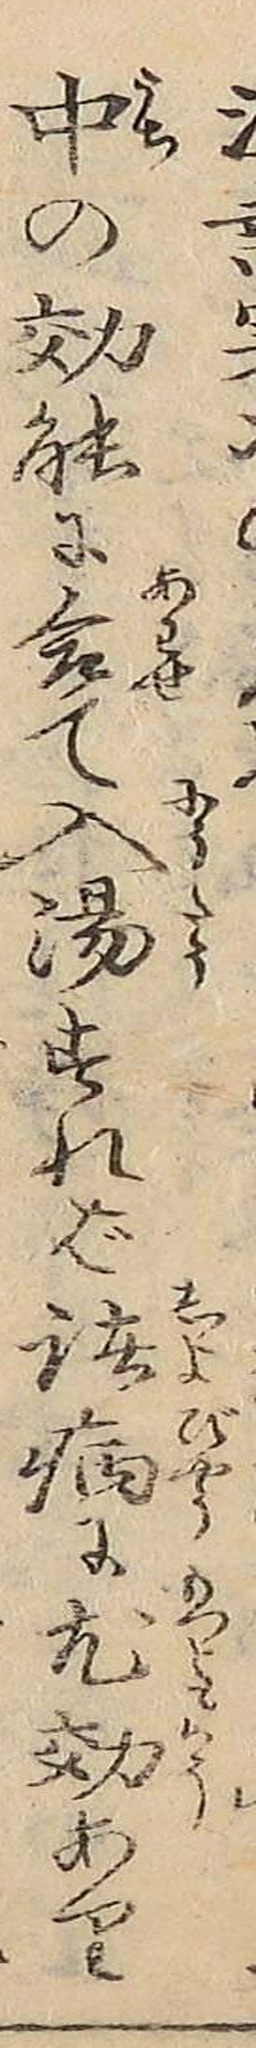中の効能に合て入湯すれば諸病に尤効あり
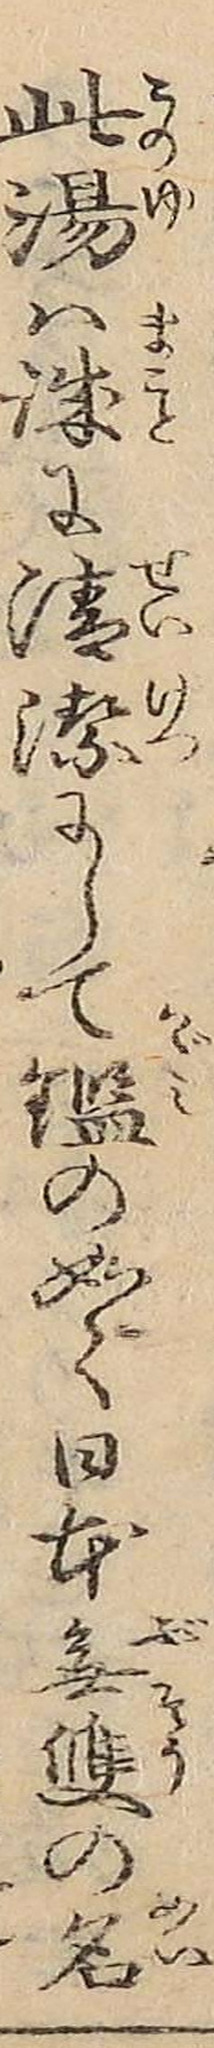此湯は誠に清潔にして鑑の如く日本無双の名
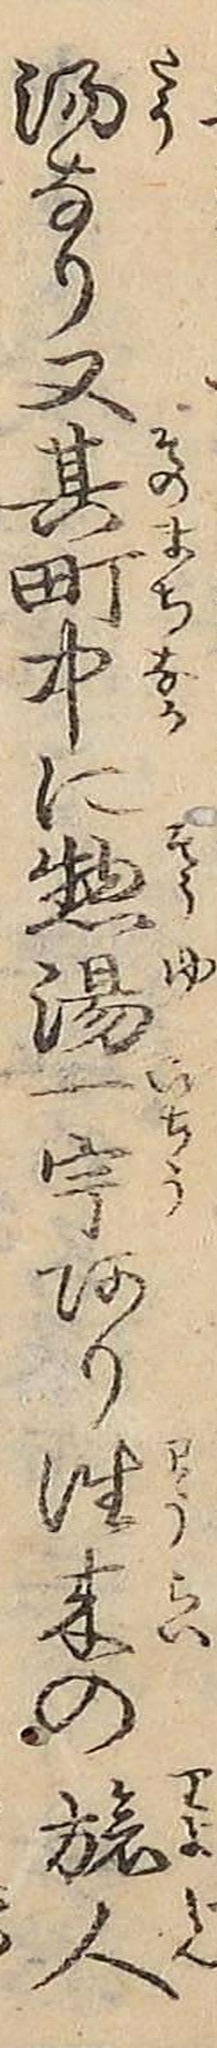湯なり又其町中に惣湯一宇あり往来の旅人
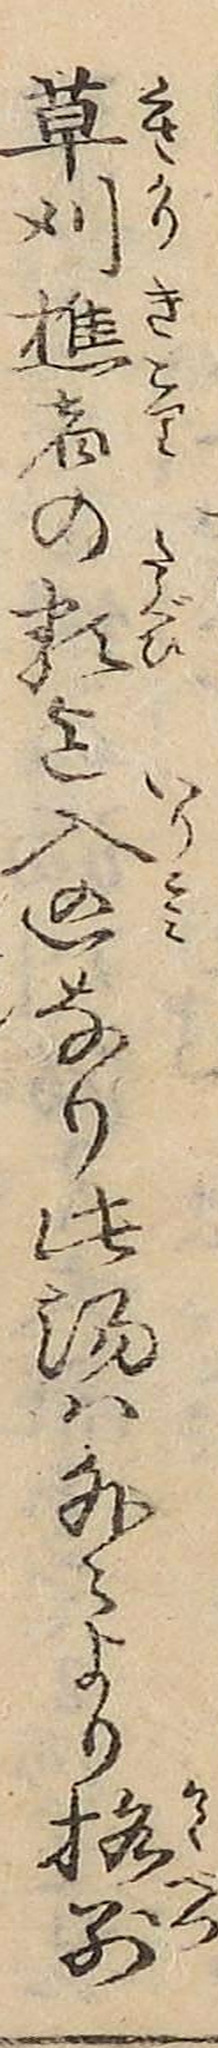草刈椎者の類迄入込なり此湯は外々より格別
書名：旅行用心集
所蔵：神戸大学附属図書館 国文学研究資料館
